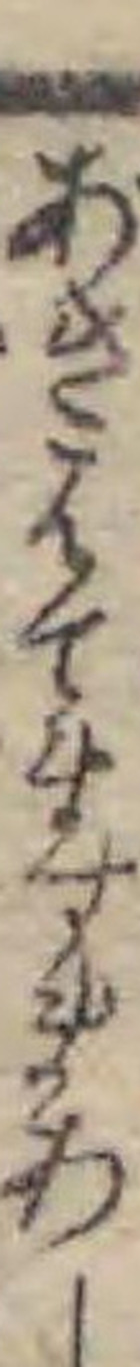あきはてますまあ
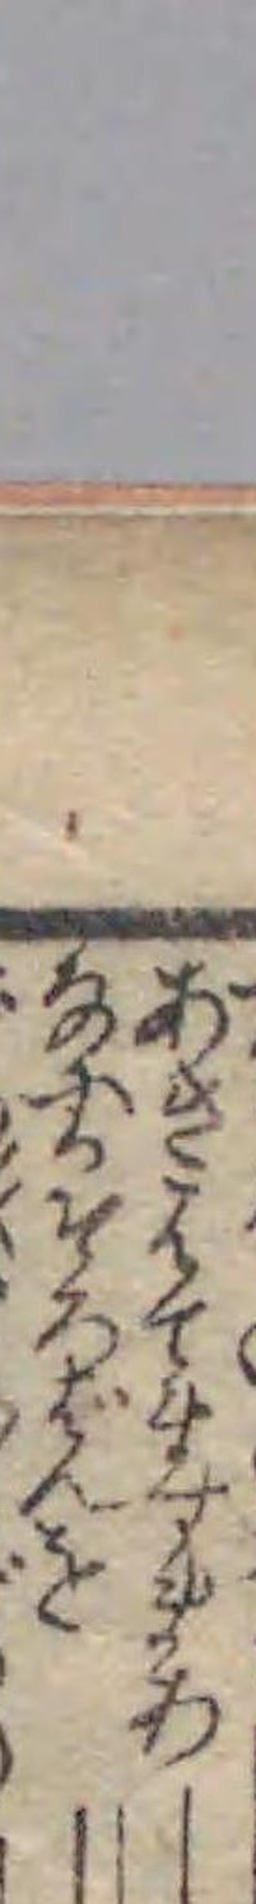なにかそろばんを
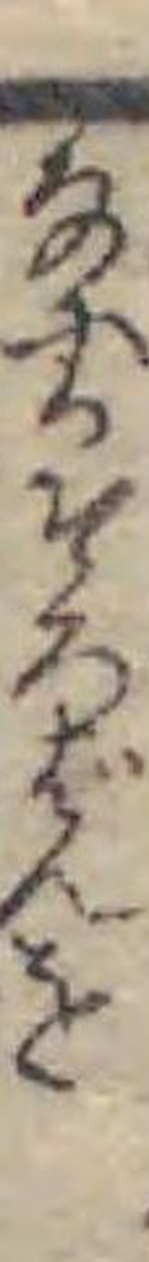なにかそろばんを
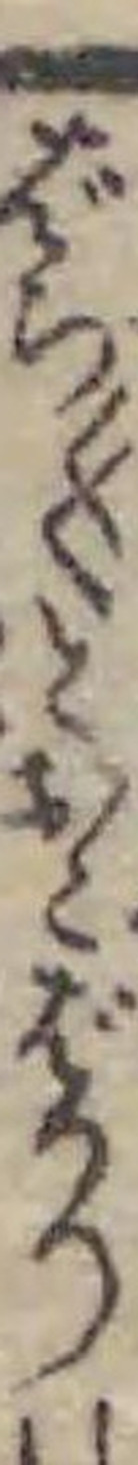ばち〳〵〳〵とおとばかり
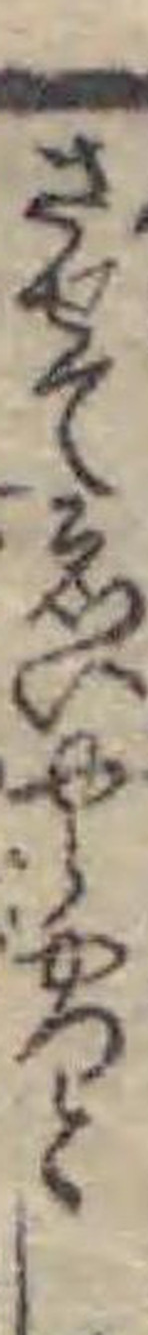させてゑいやらやつと
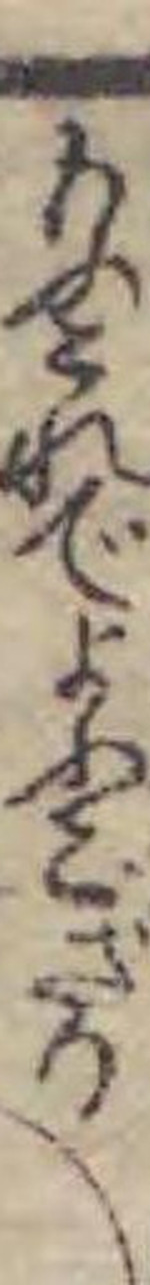もふこれでよふござり
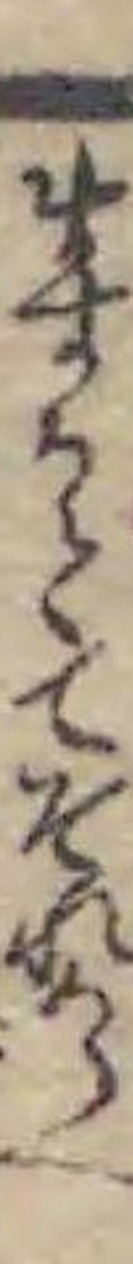ますかとてそれから
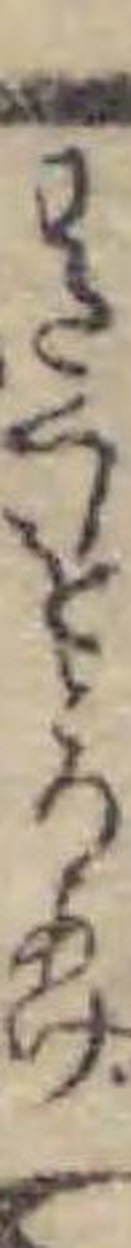わたくしをとりあげ
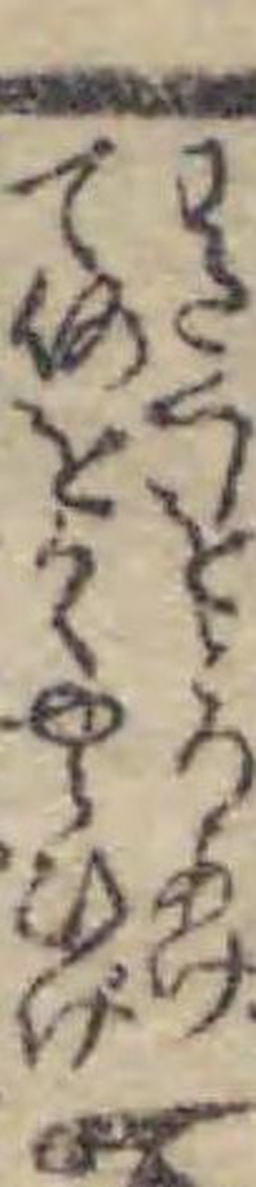て何をかくやらひげ
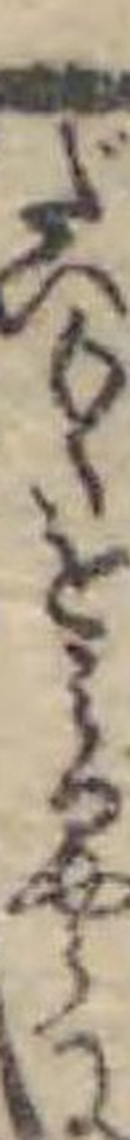だいもくをみるやうに
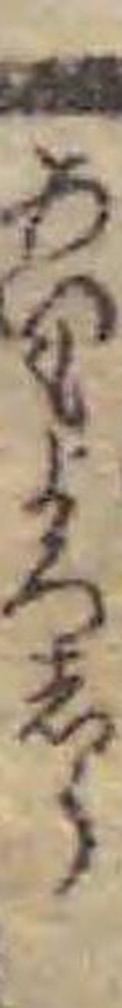あいもよろしう
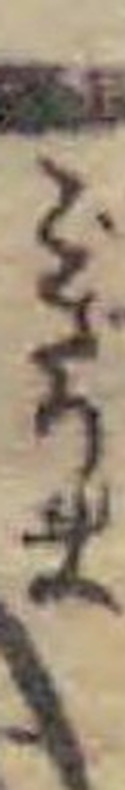ござりま
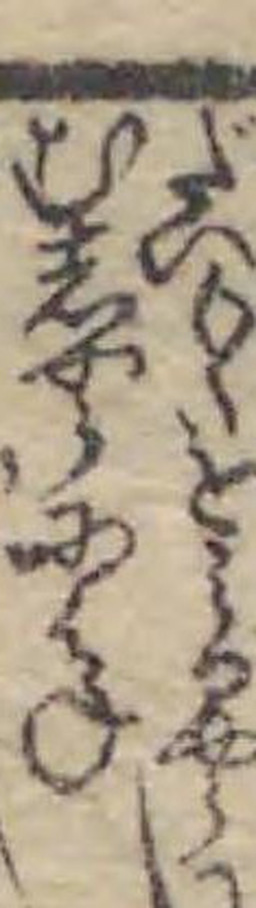むしやうにはね
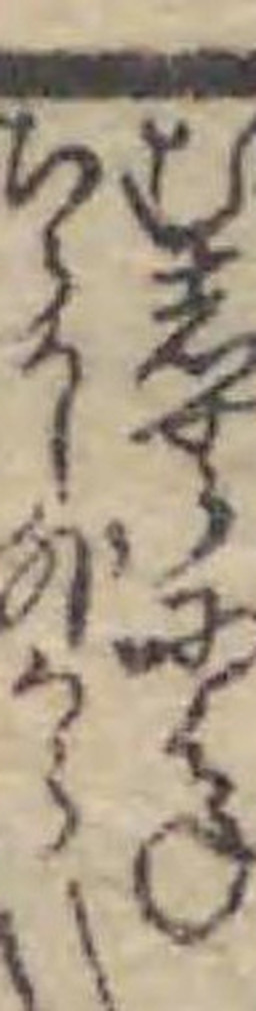ちらかし外から
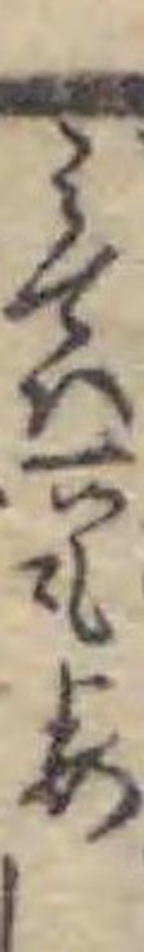みては一ツもよめ
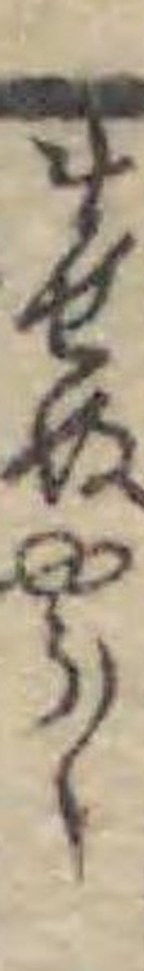ませぬやう〳〵
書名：紙屑身上噺 : 3巻
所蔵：国立国会図書館 National Diet Library, JAPAN
